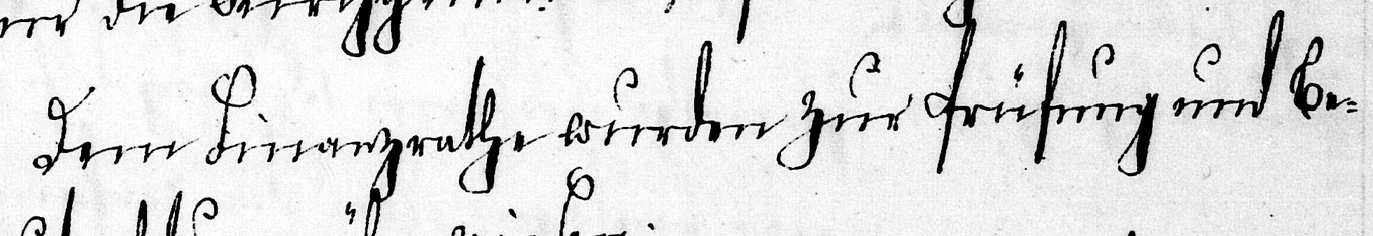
Dem Finanzrathe wurden zur Prüfung und Be¬
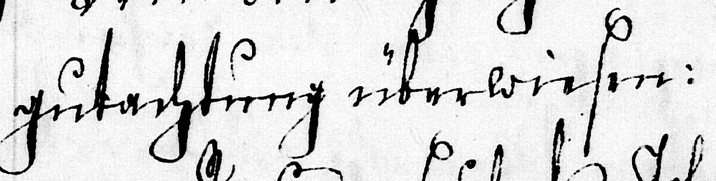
gutachtung überwiesen:
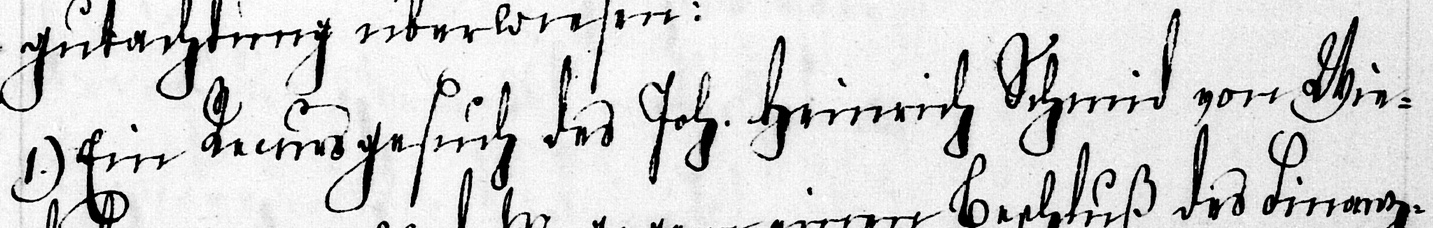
1.) Ein Recursgesuch des Joh. Heinrich Schmid von Wie¬
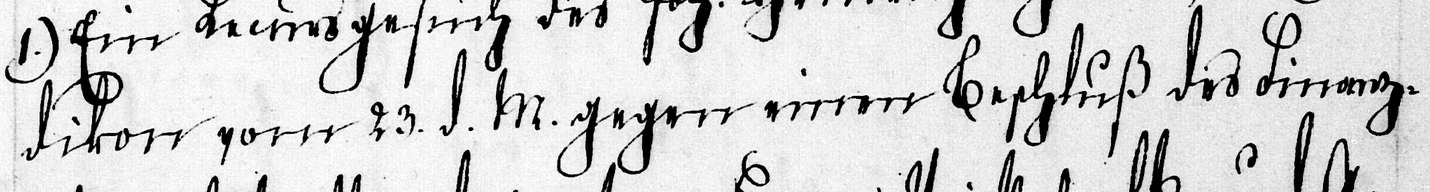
dikon vom 23. d. M. gegen einen Beschluß des Finanz¬
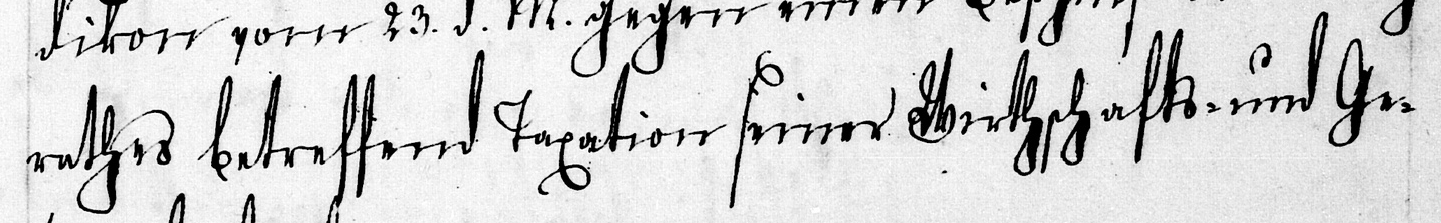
rathes betreffend Taxation seiner Wirthschafts- und Ge¬
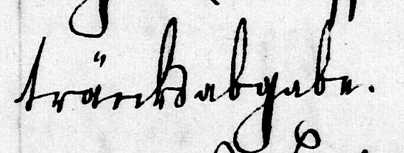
tränksabgabe.
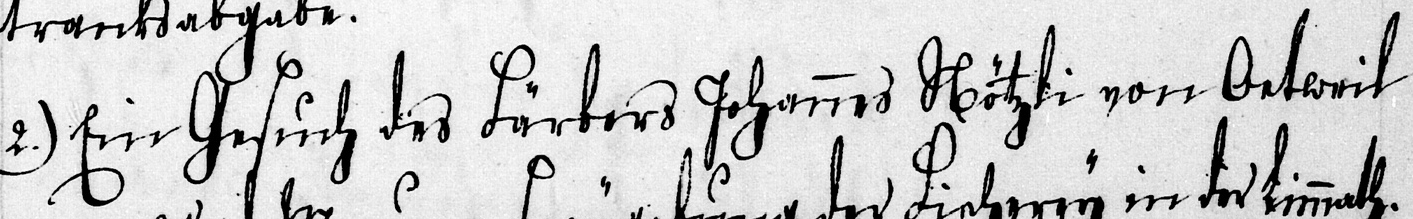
2.) Ein Gesuch des Färbers Johannes Nötzli von Oetweil
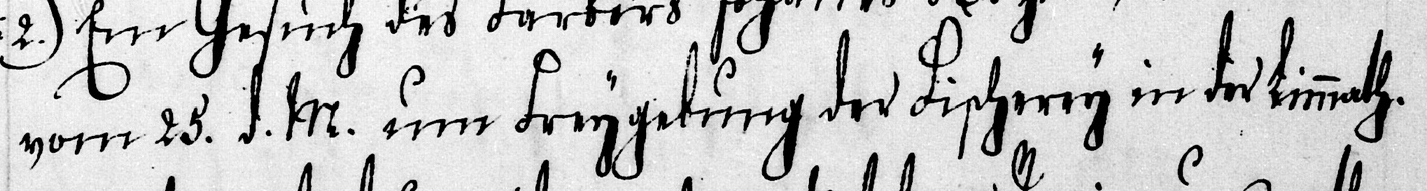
vom 25. d. M. um Freygebung der Fischerey in der Limmat¬
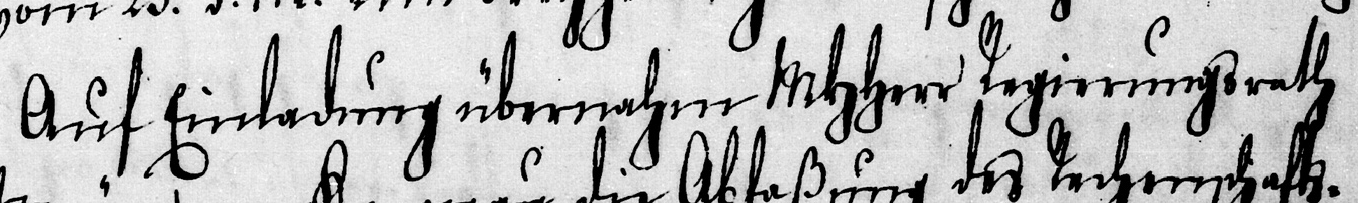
Auf Einladung übernahm MHHerr Regierungsrath
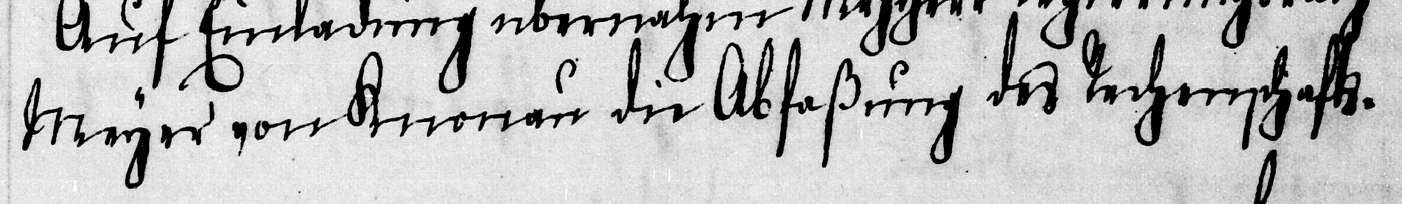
Meyer von Knonau die Abfaßung des Rechenschafts-
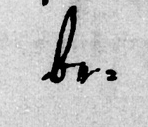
be¬
